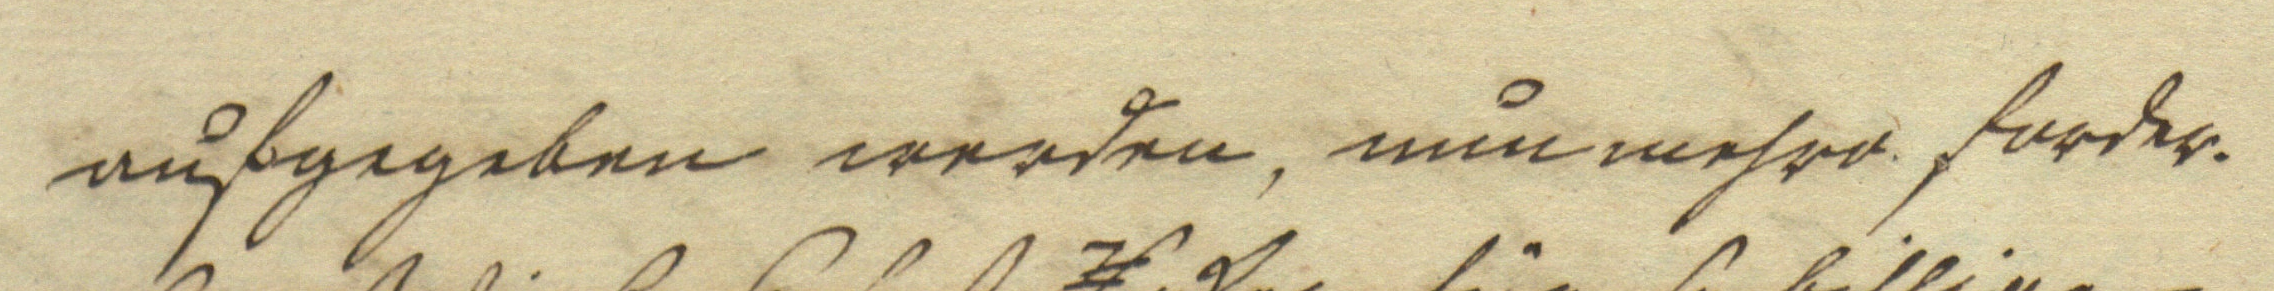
aufgegeben werden, nunmehro forder¬
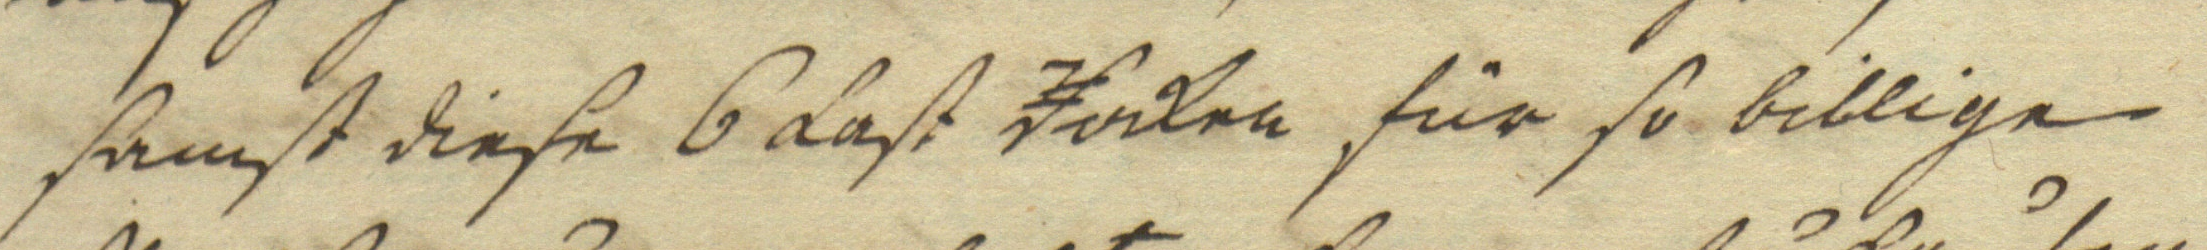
samst diese 6 Last Rocken für so billige
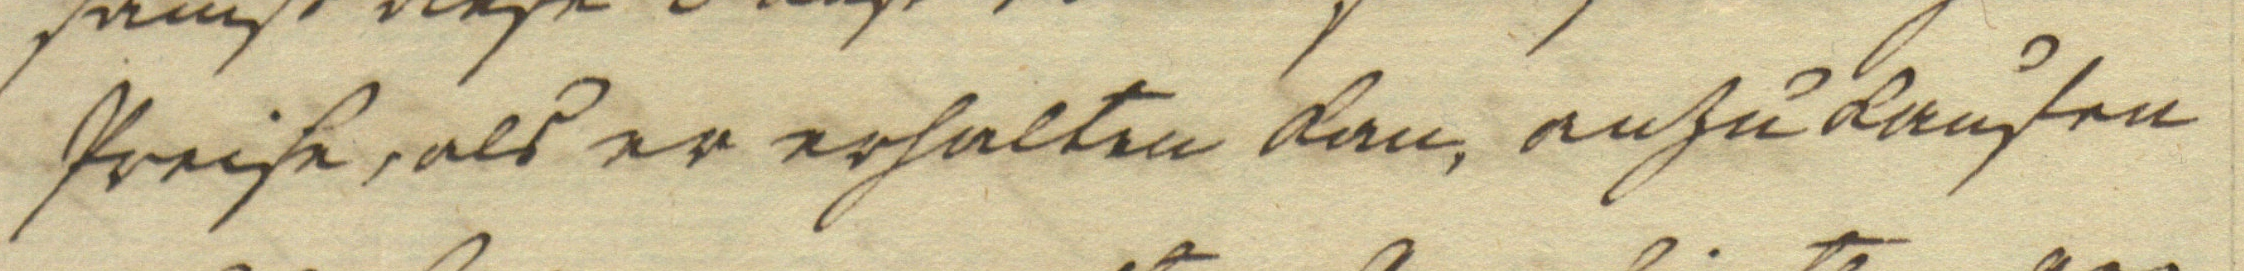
Preise, als er erhalten kan, anzukaufen
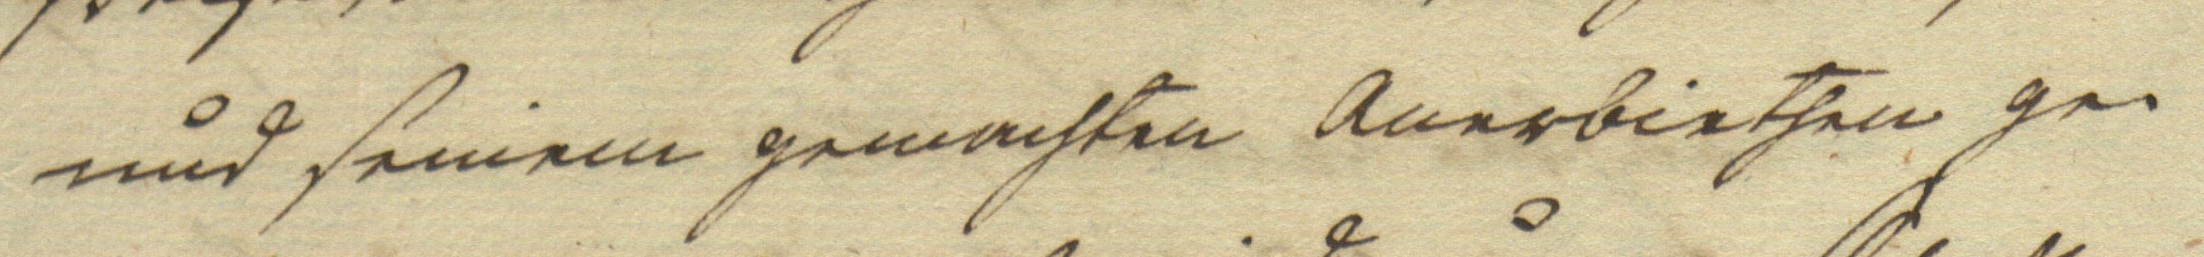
und seinem gemachten Anerbiethen ge¬
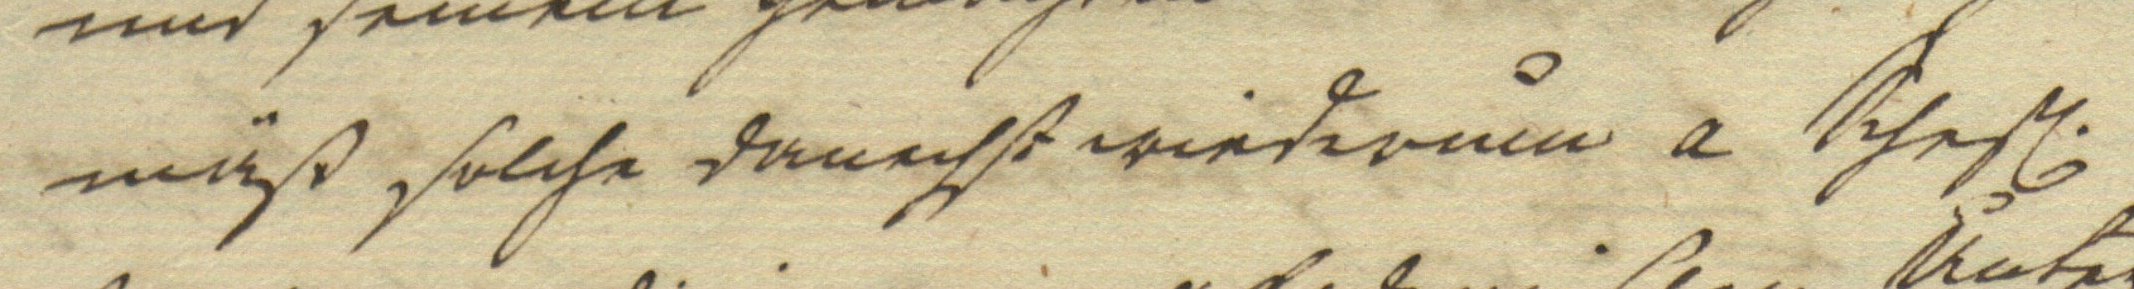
mäß solche danechst wiederum a Schefl.¬
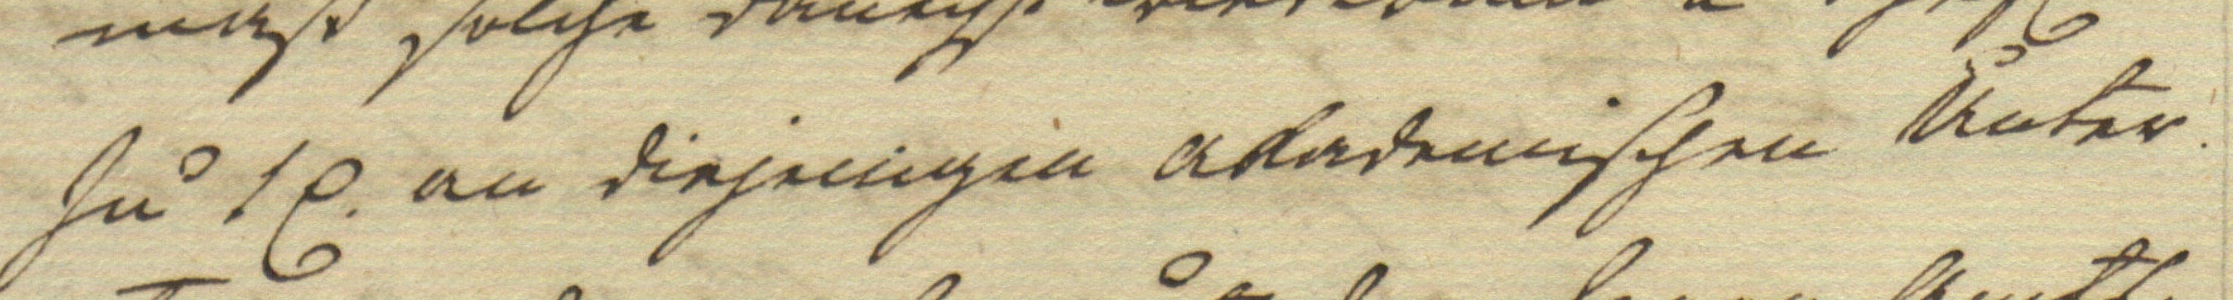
zu 1 l. an diejenigen akademischen Unter¬
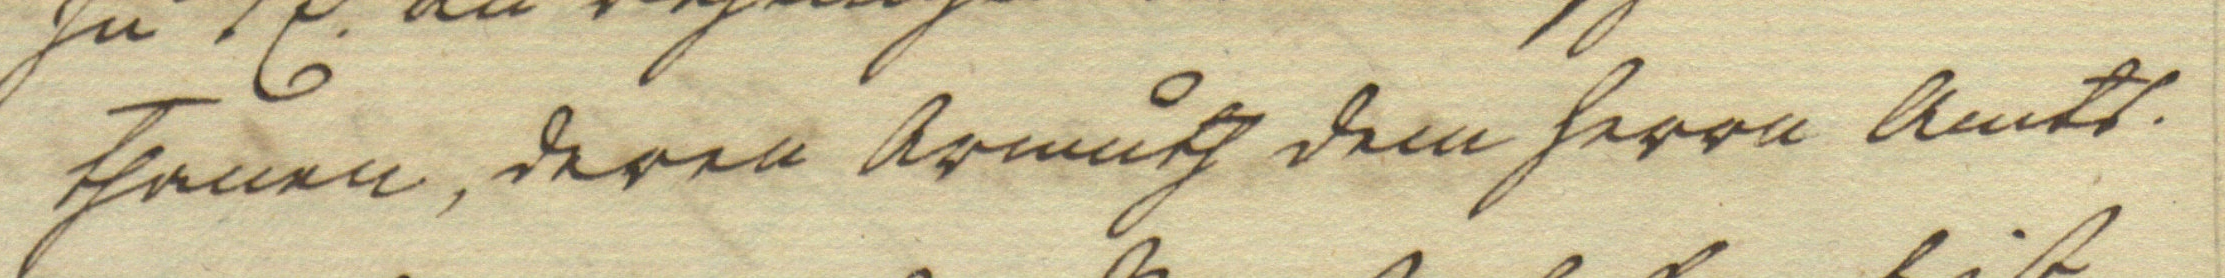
thanen, deren Armuth dem Herrn Amts¬
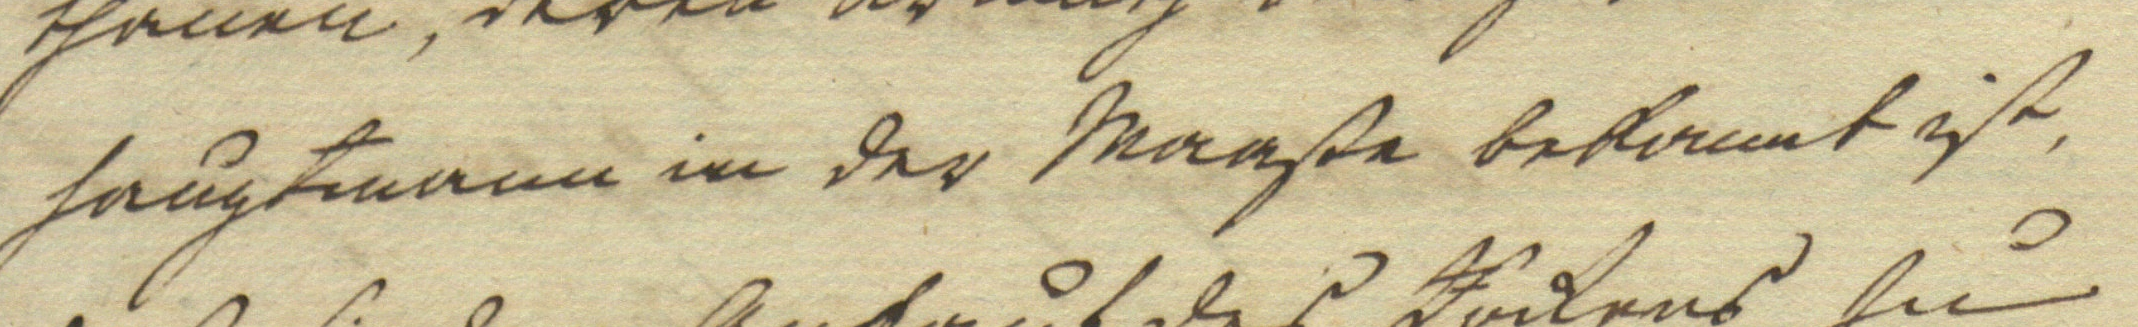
hauptmann in der Maaße bekannt ist,
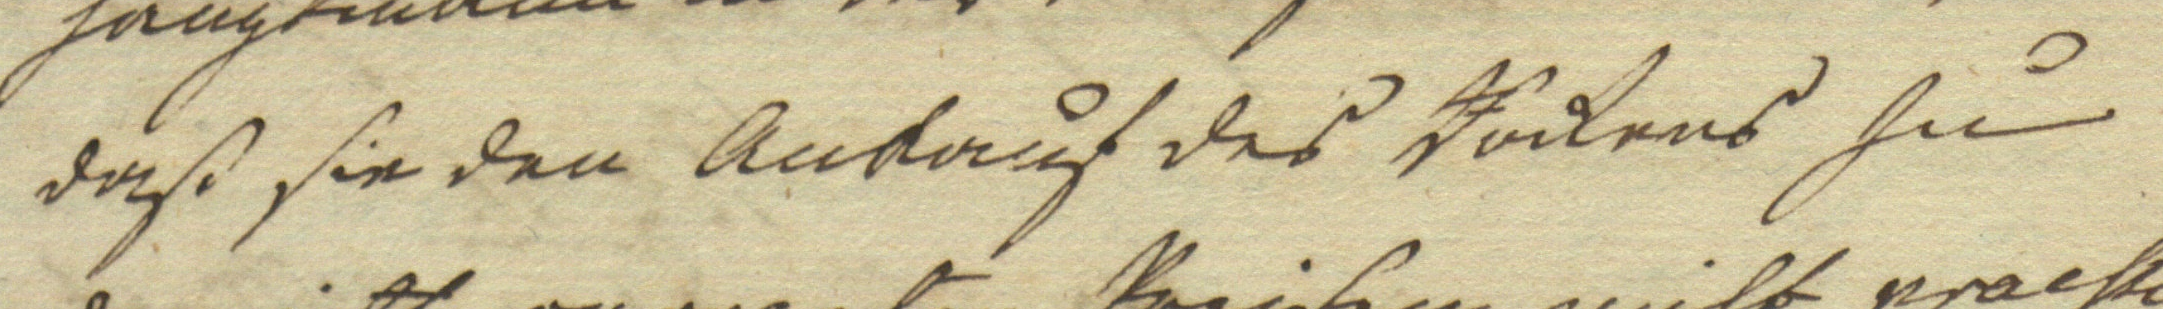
daß sie den Ankauf des Rockens zu
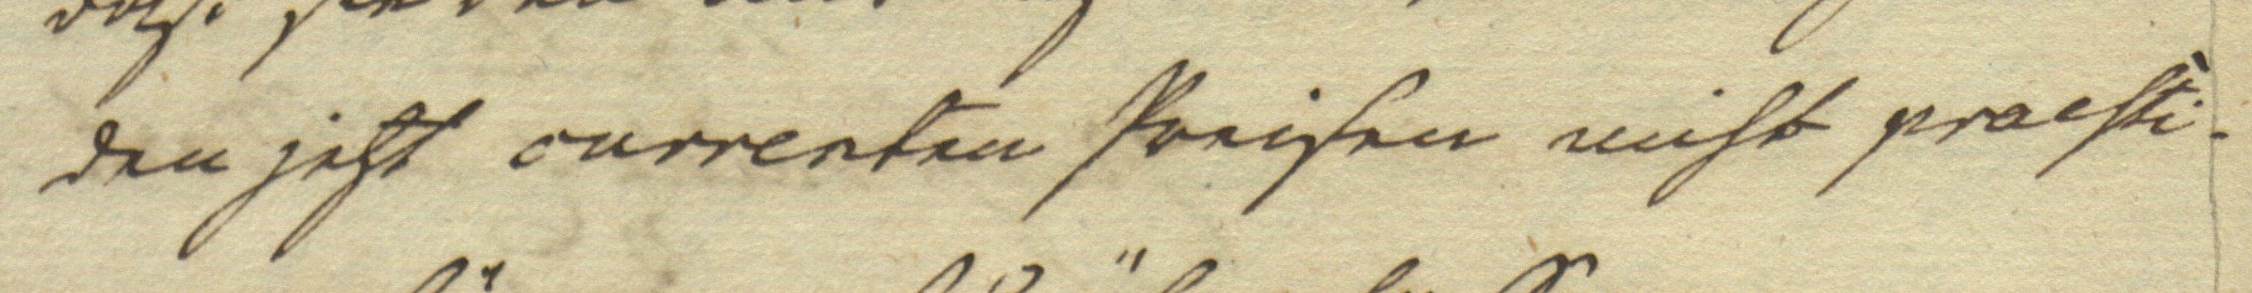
den jetzt currenten Preisen nicht praesti¬
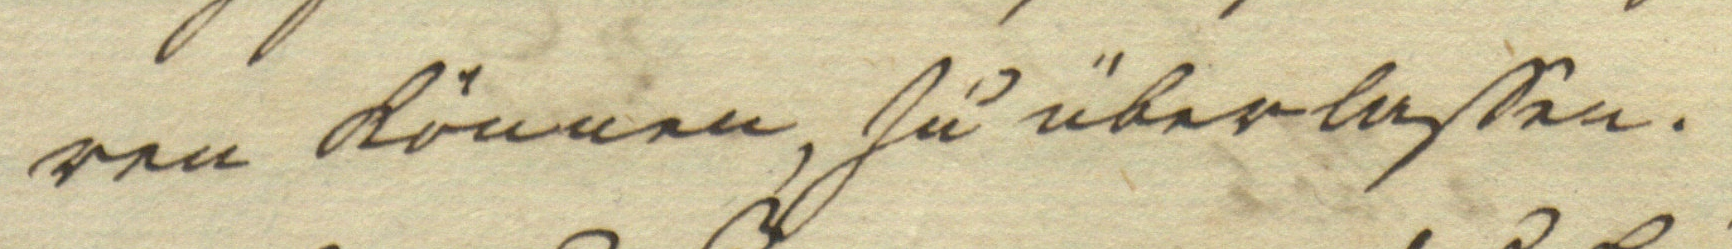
ren können, zu überlassen.
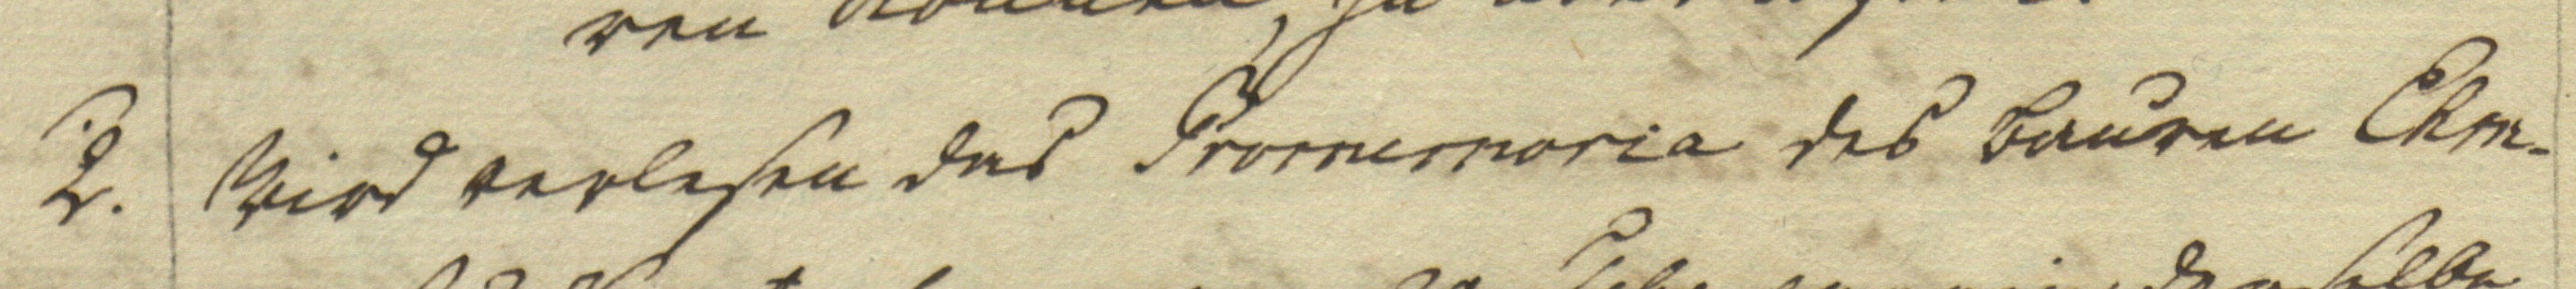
2. Wird verlesen des Promemoria des Bauren Ehm
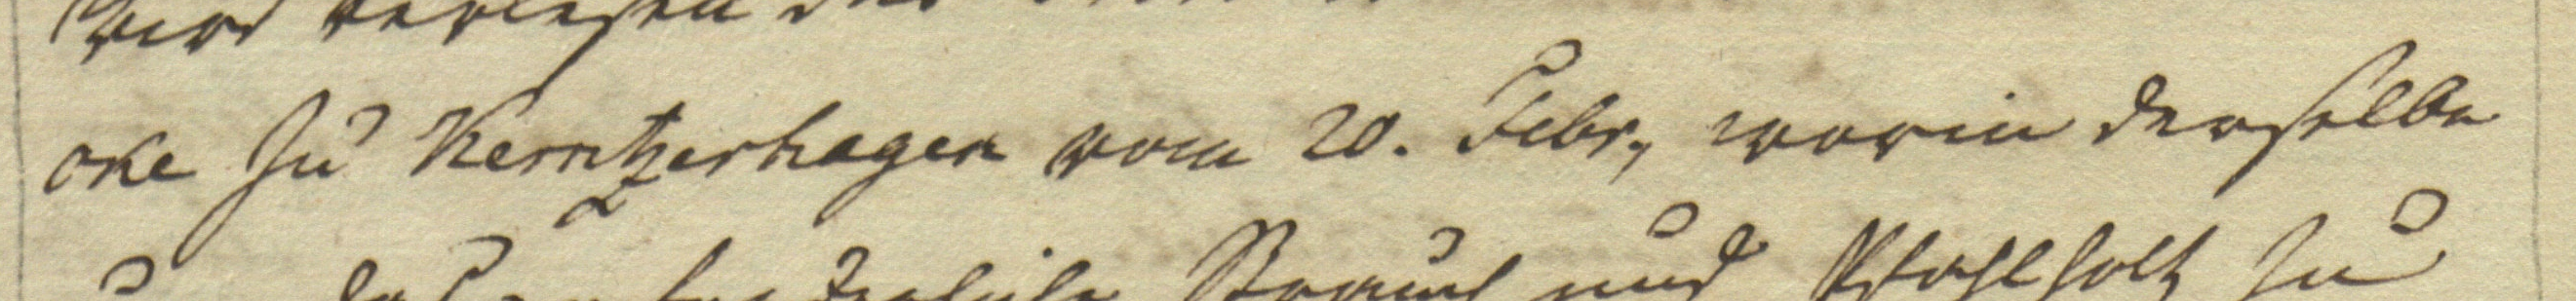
cke zu Kemtzerhagen vom 20. Febr., worin derselbe
